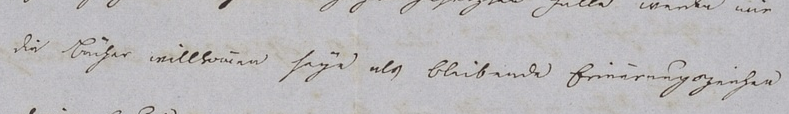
die Bücher willkommen seyn als bleibende Erinnerungszeichen
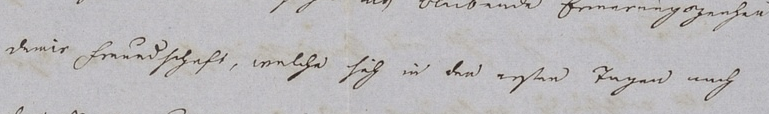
deiner Freundschaft, welche sich in den ersten Tagen nach
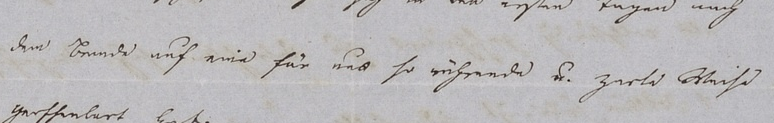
dem Brande auf eine für uns so rührende u. zarte Weise
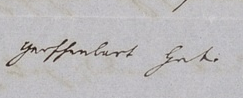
geoffenbart hat.
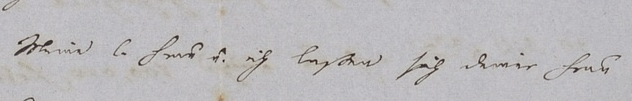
Meine l. Frau u. ich lassen sich Deiner Frau
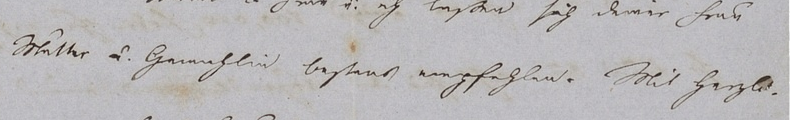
Mutter u. Gemahlin bestens empfehlen. Mit herzli-
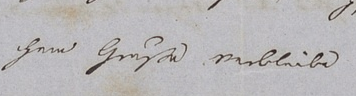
chem Gruße verbleibe
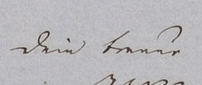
Dein treuer
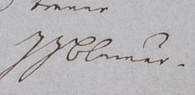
J J Blumer.
